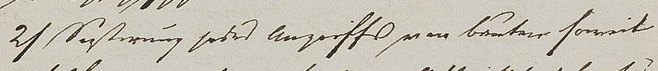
2) Sistirung jedes Angriffs von Bauten soweit
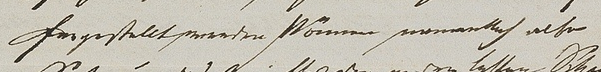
hergestellt werden können namentlich also
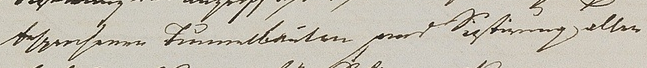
besprochenen Tunnelbauten, und Sistirung aller
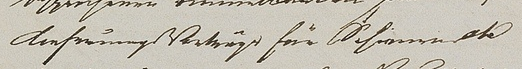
LieferungsVerträge für Schienen etc.
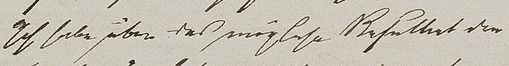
Ich habe über das mögliche Resultat der
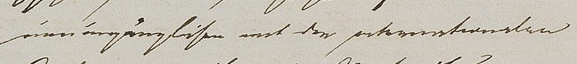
unumgänglichen mit der internationalen
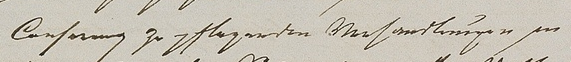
Conferenz zu pflegenden Verhandlungen in
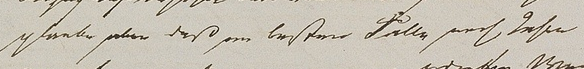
glaube aber daß im besten Falle noch Jahre
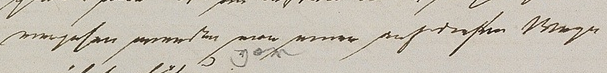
vergehen werden vor einer auf diesem Wege
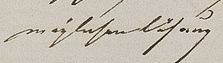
möglichen Lösung.
